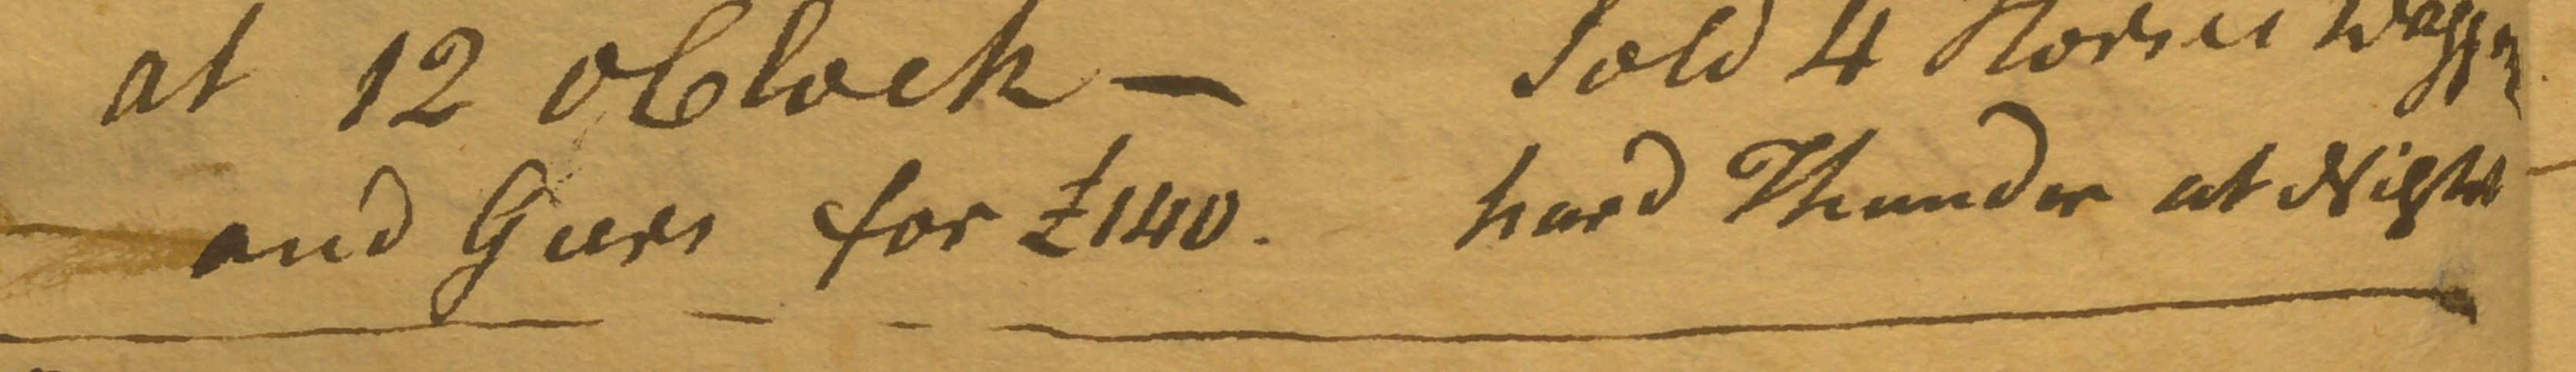and Geers for £140. hard Thunder at Night
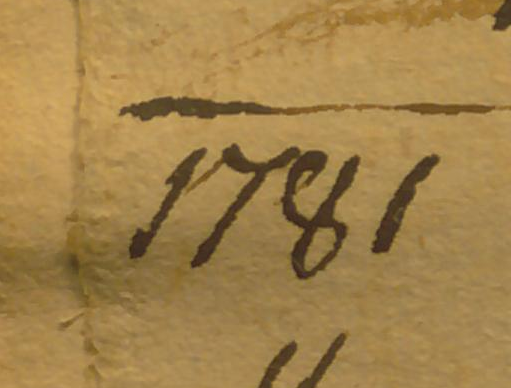1781
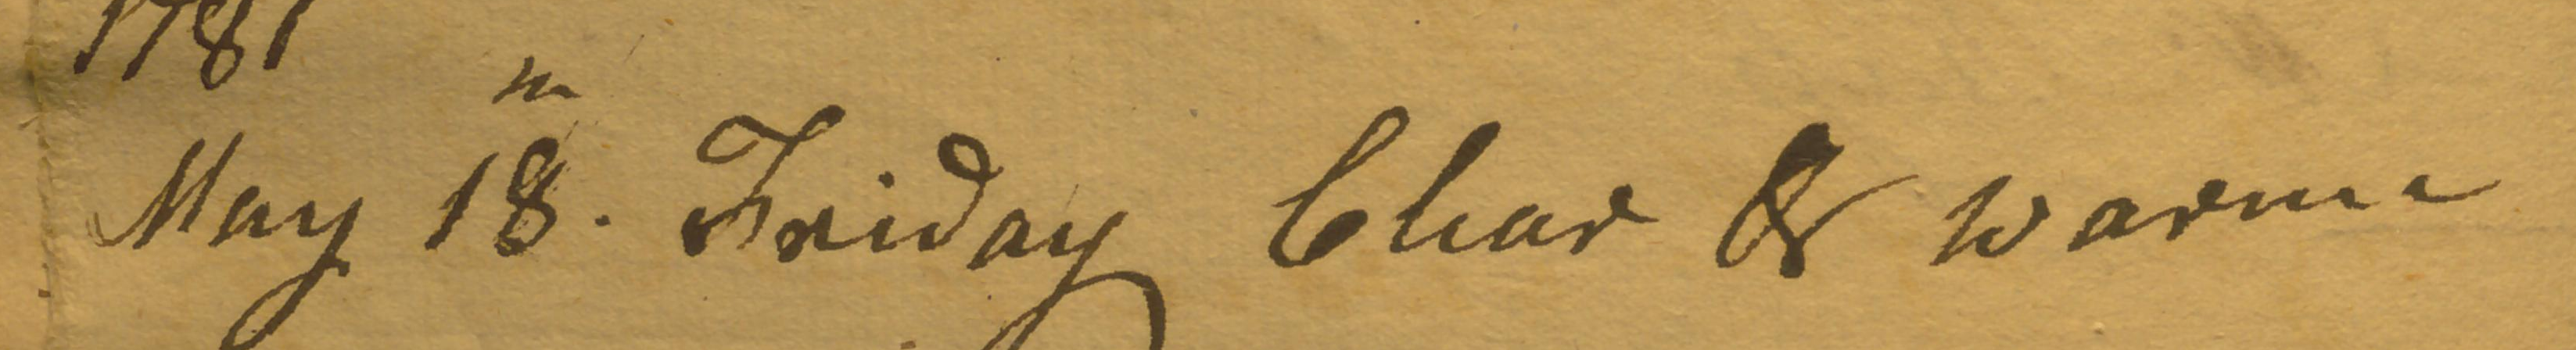May 18h. Friday, Clear & warme
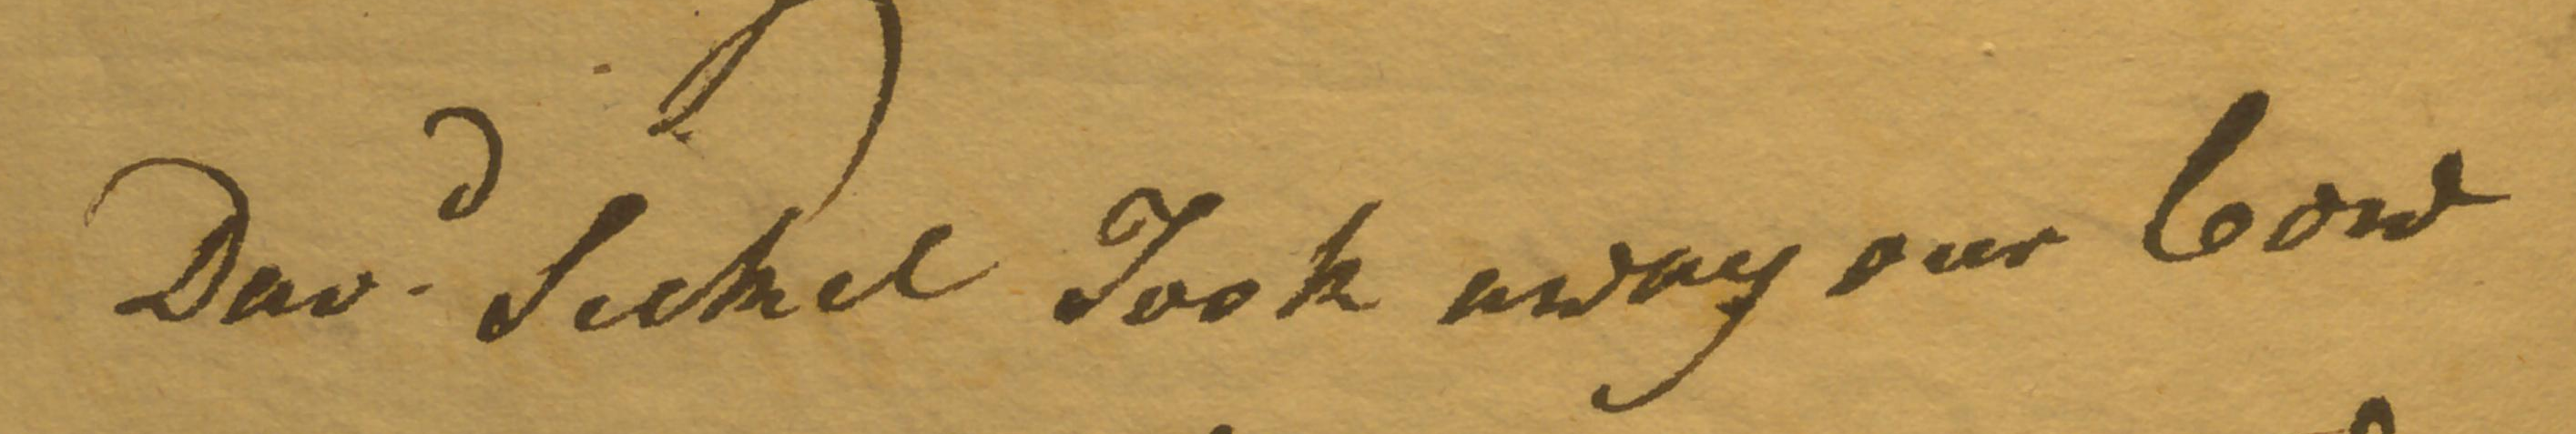Dav^d. Seckel Took away our Cow
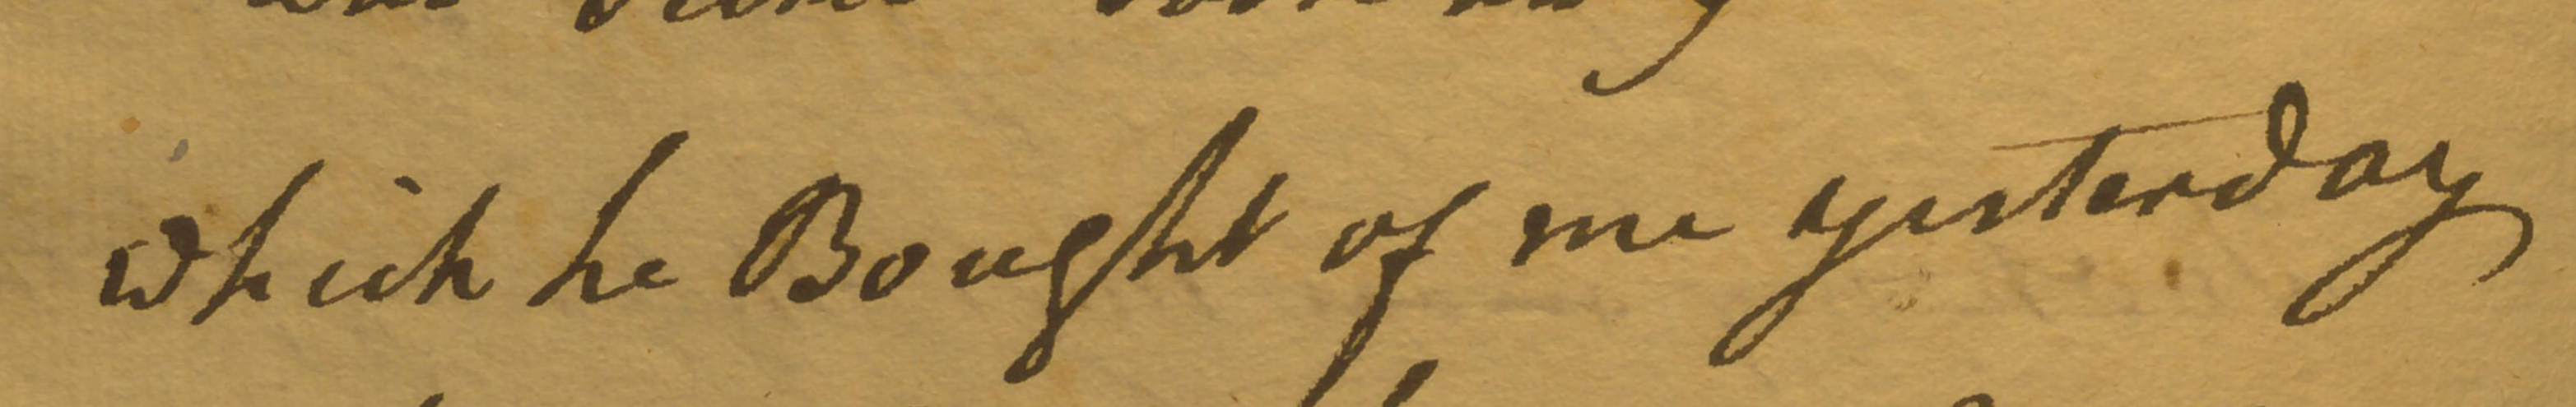which he Bought of me yesterday
